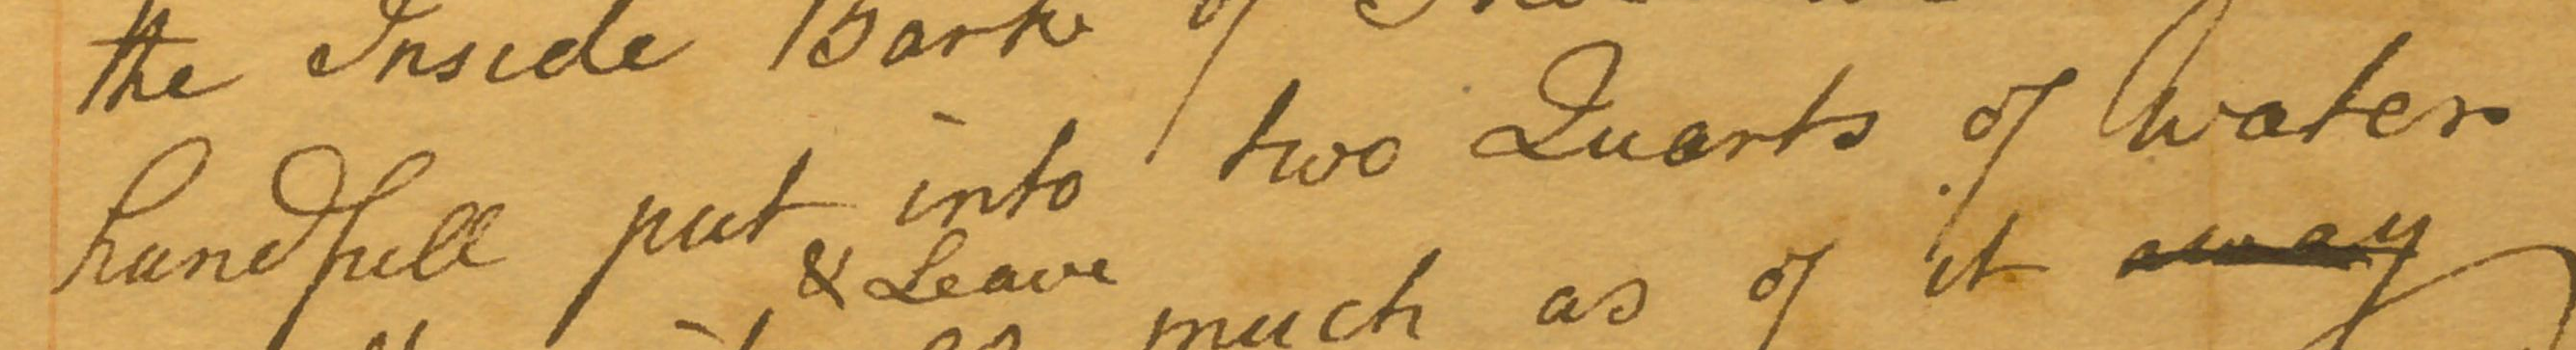handfull put into two Quarts of water
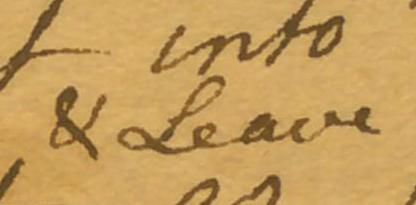& Leave
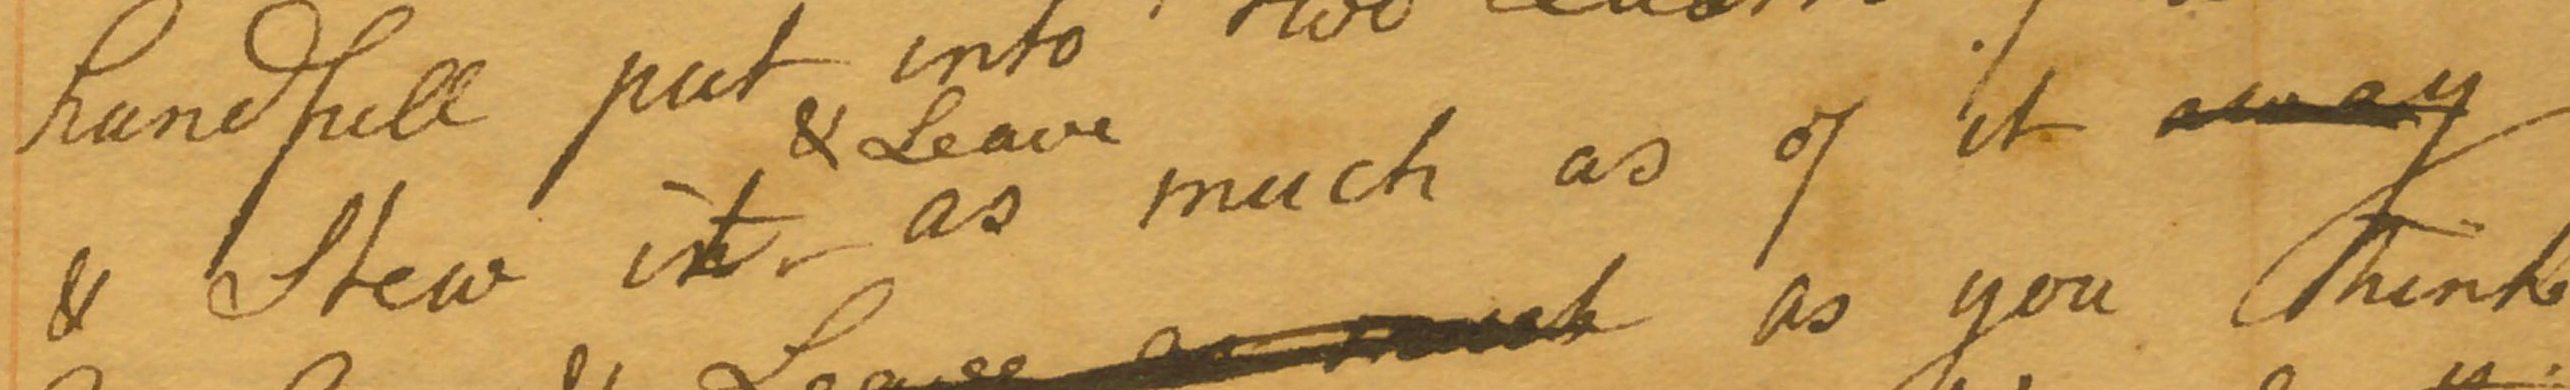& stew it ^ as much as of it [away]
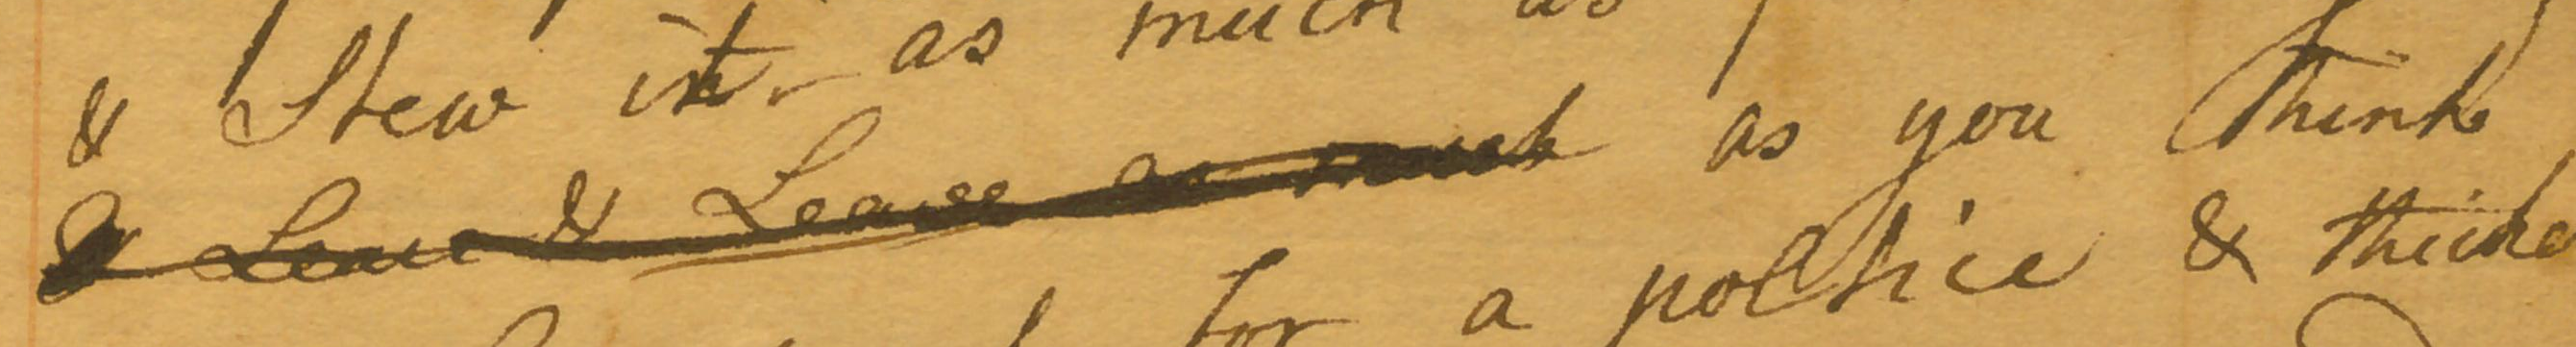[& Leave & Leave a week] as you think
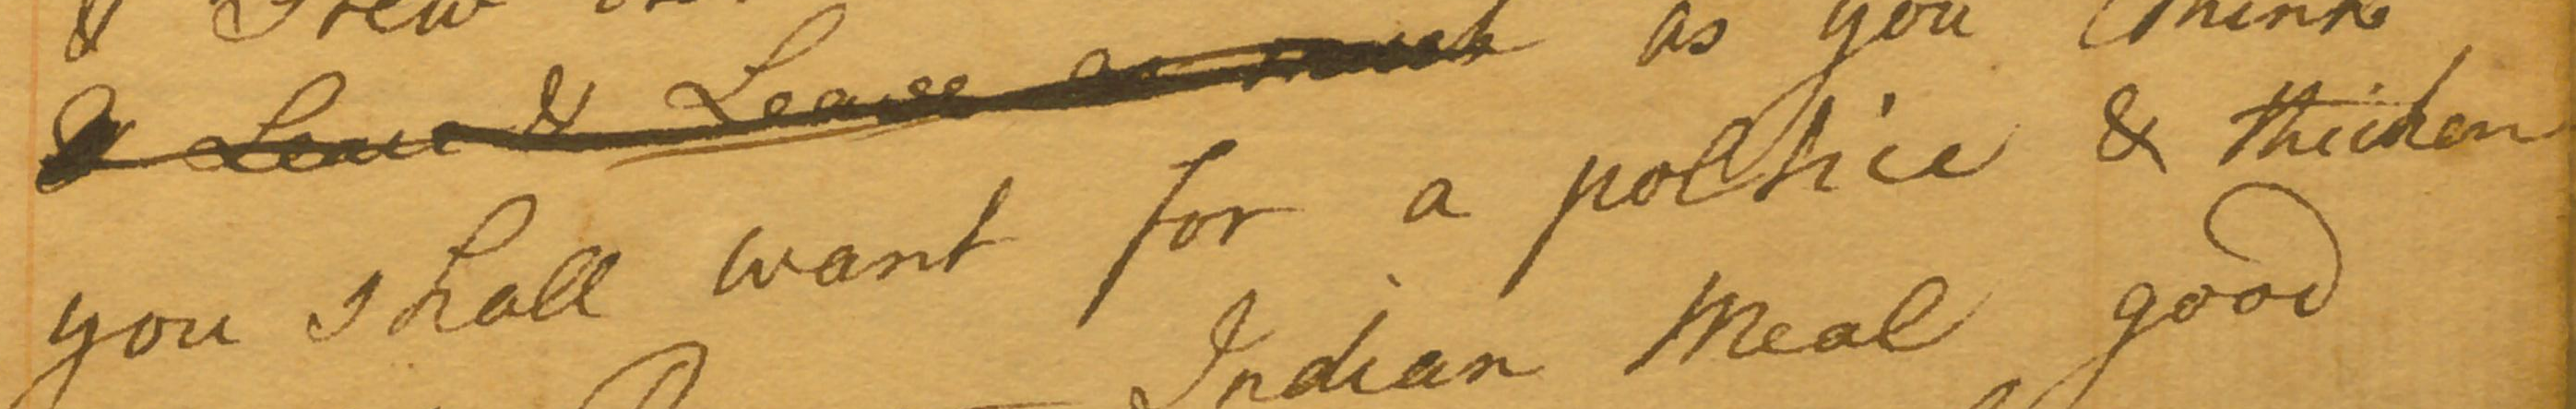you shall want for a poltice & thicken
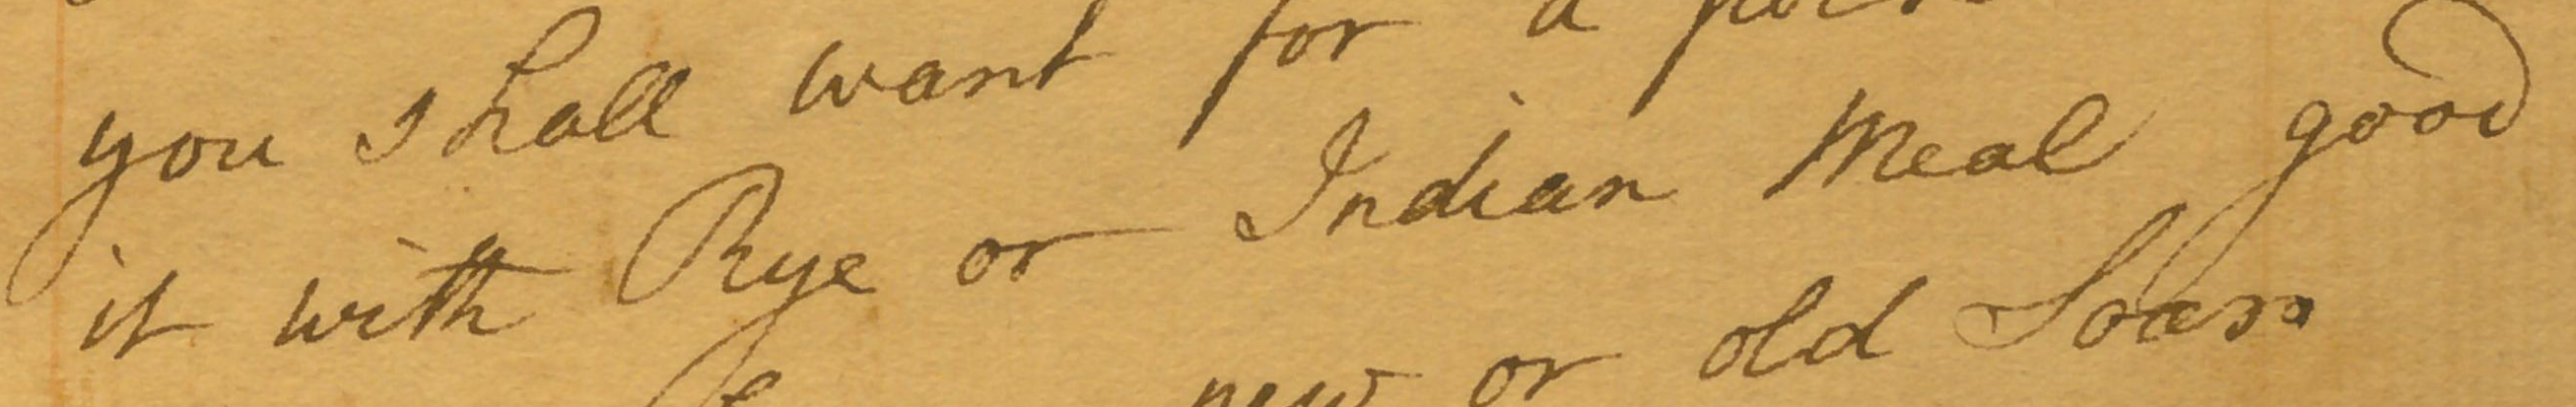it with Rye or Indian Meal good
